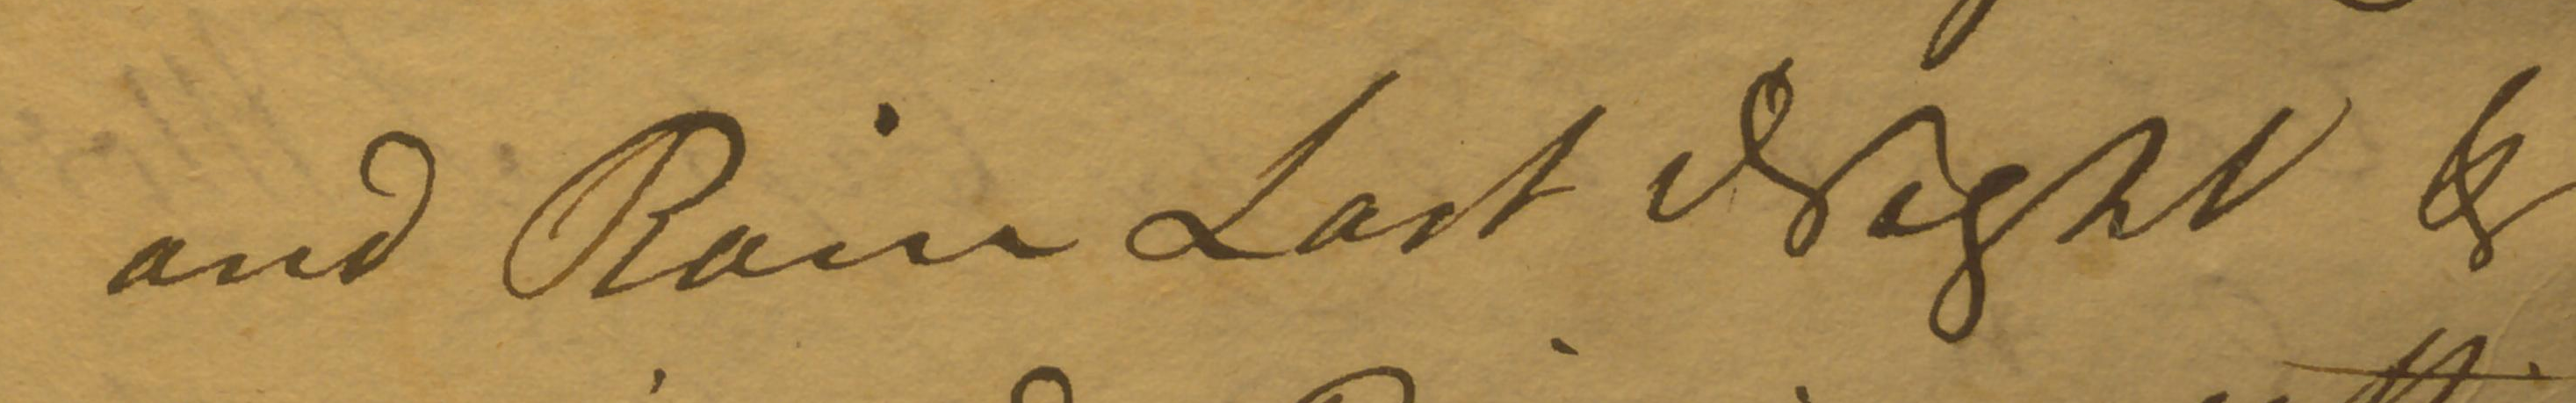and Rain Last Night &
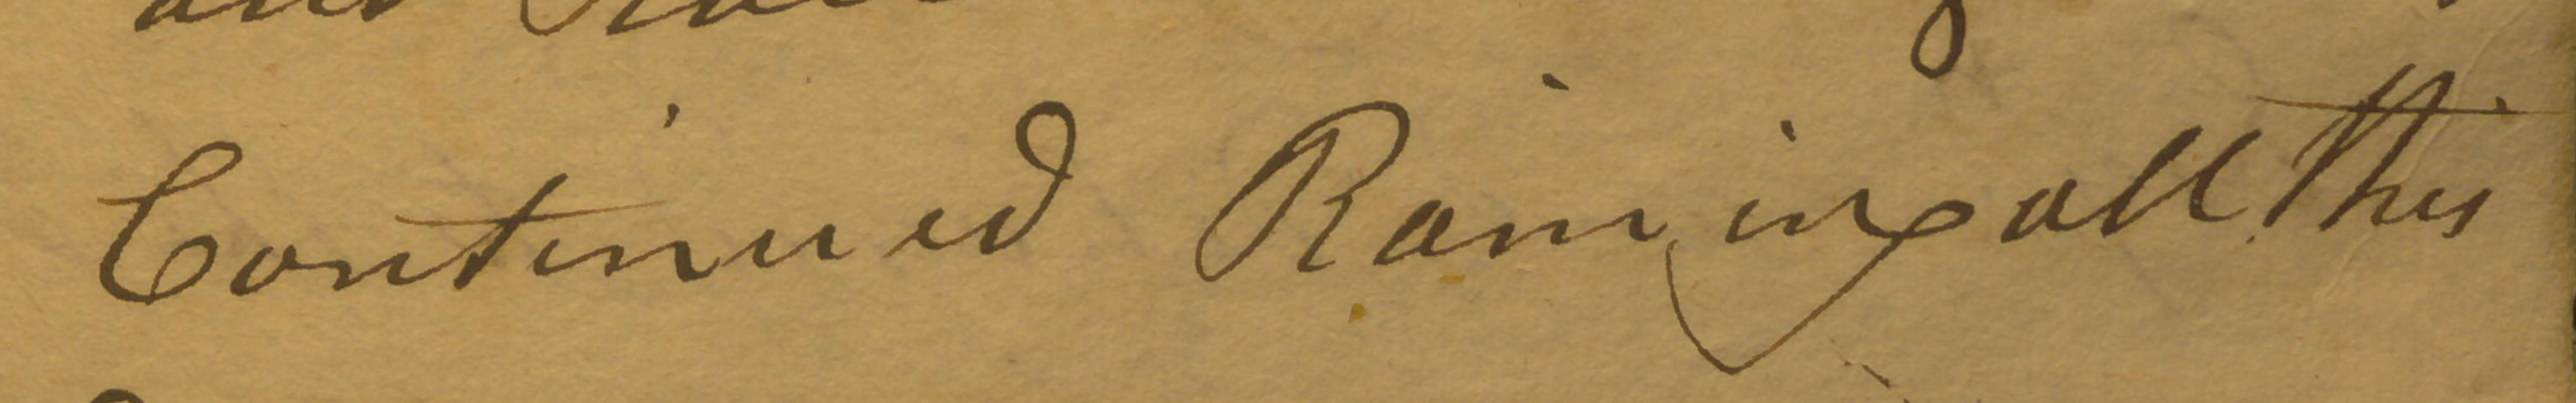Continued Raining all this
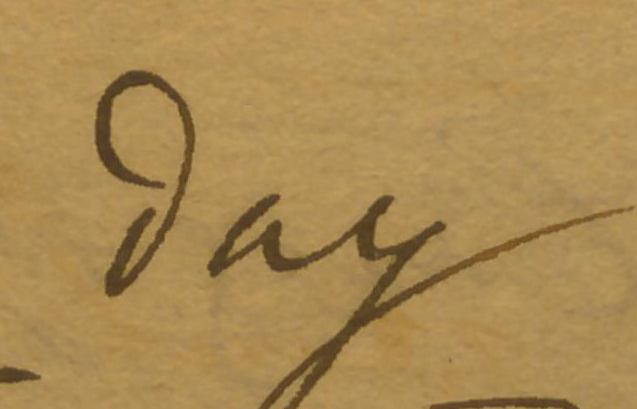day
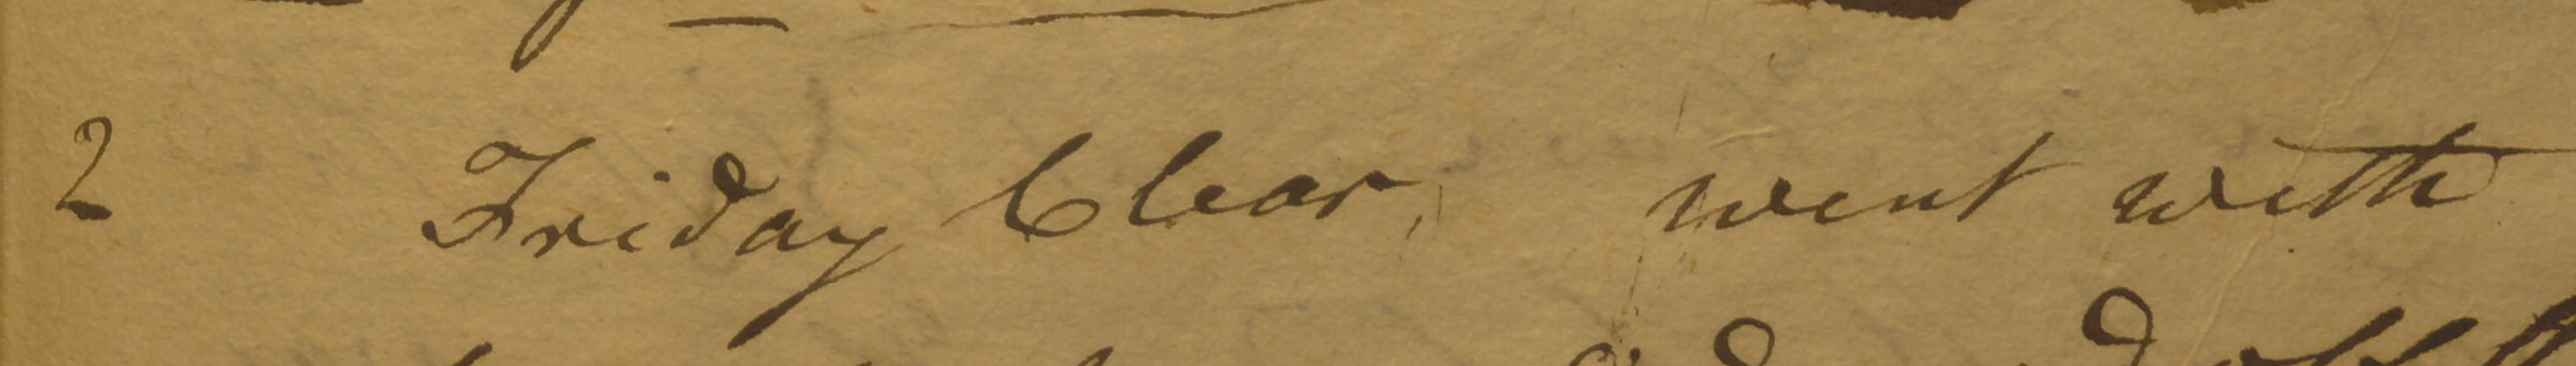2 Friday Clear, went with
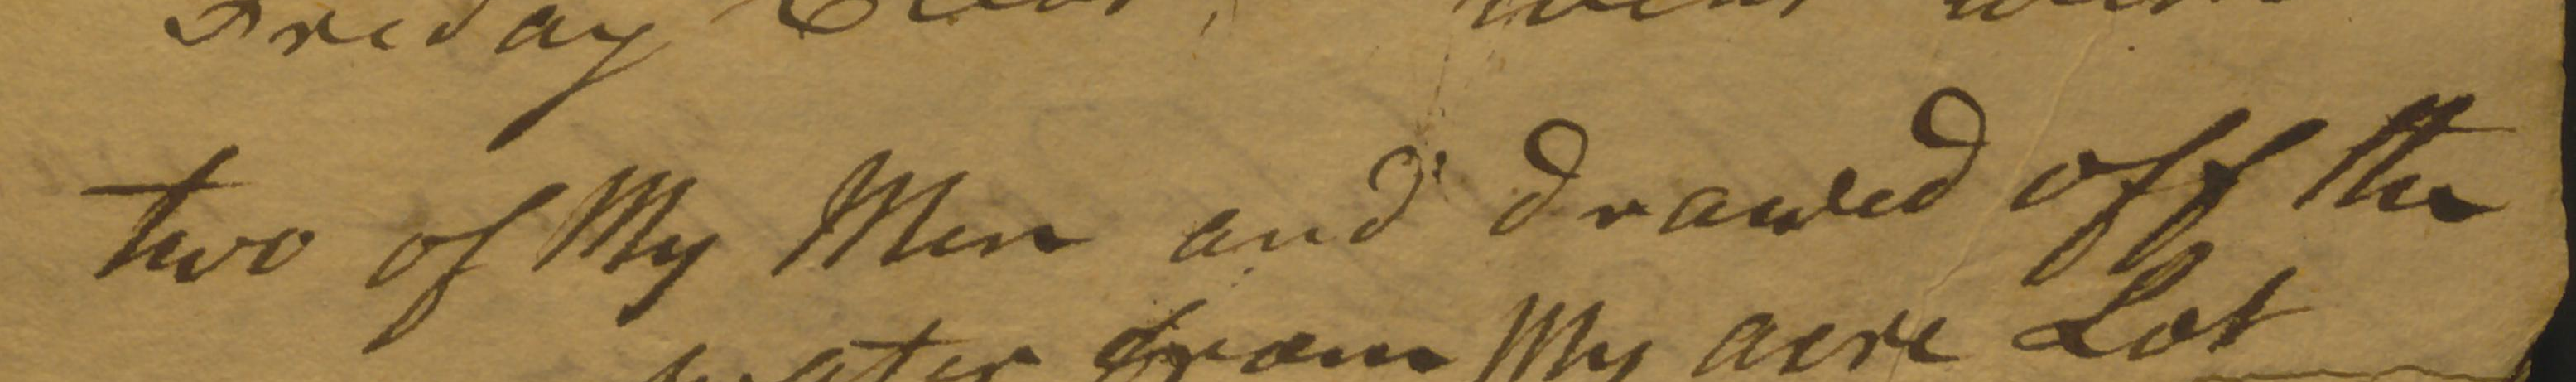two of My Men and drawed off the
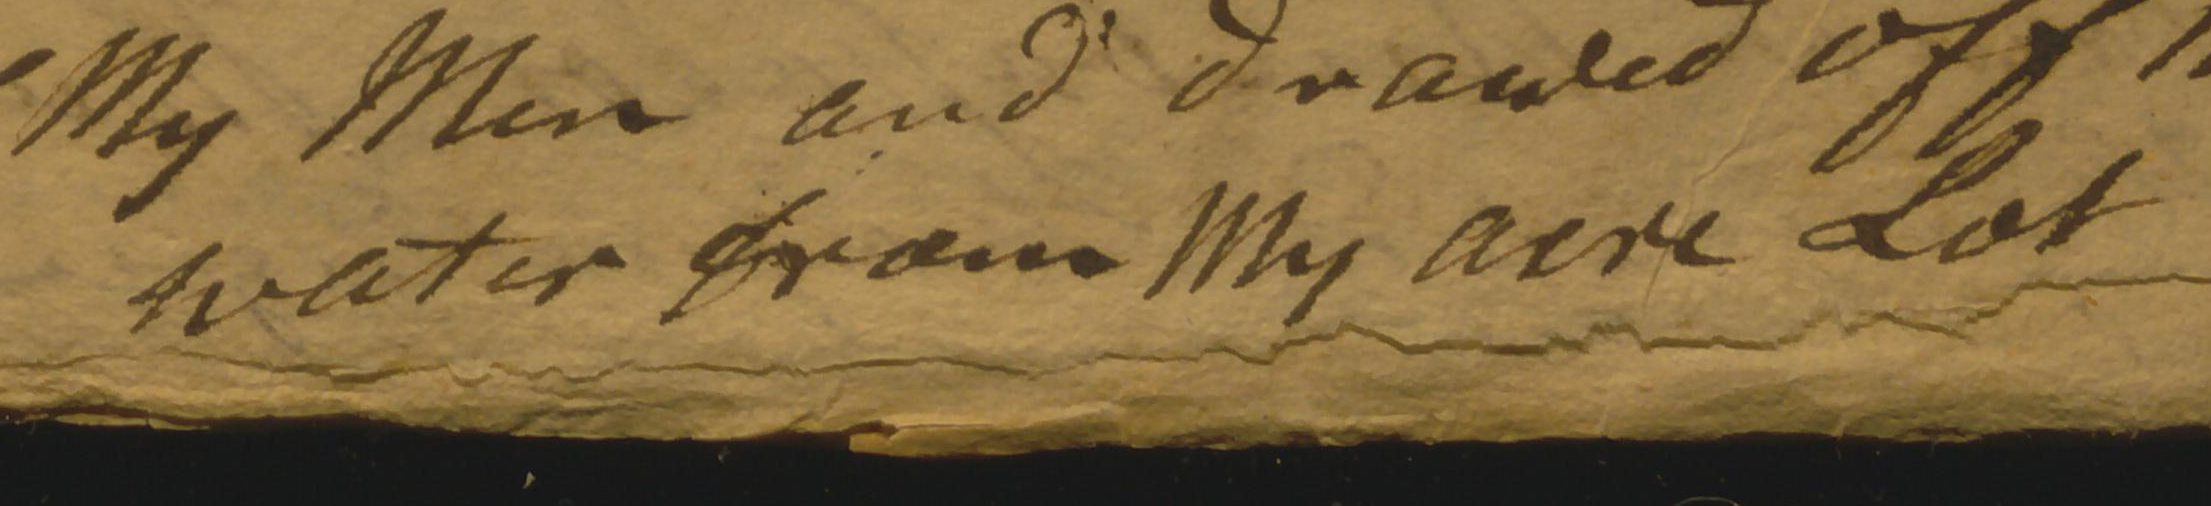water from My acre Lot
